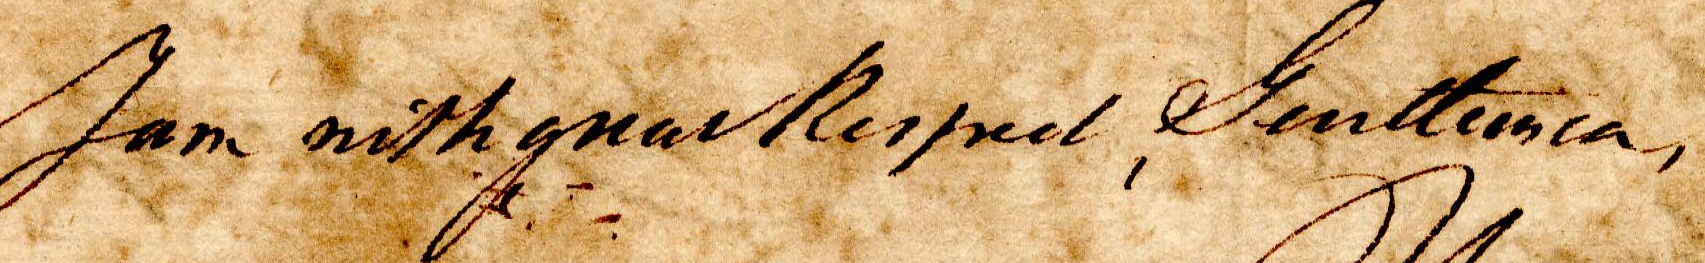I am with great Respect, Gentlemen
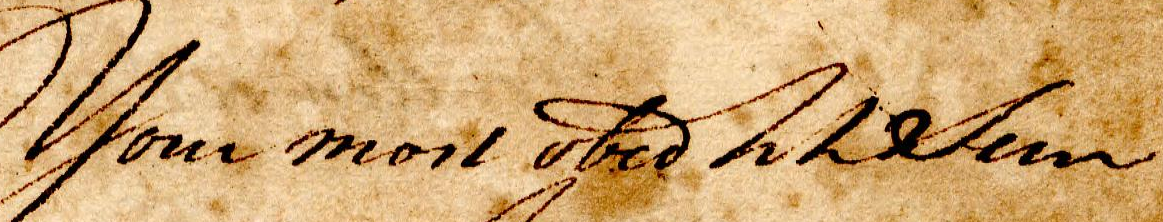Your most obed hle Serv
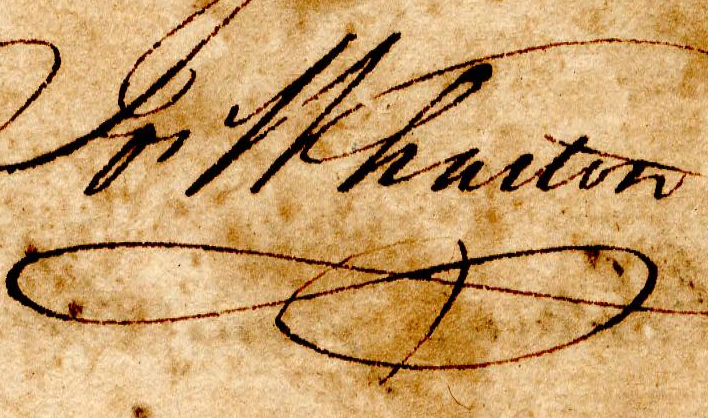Jos Wharton
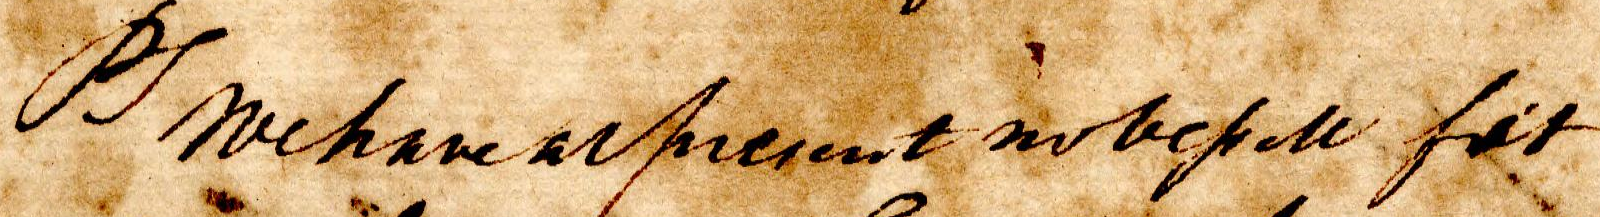PS We have at present no vessell fit
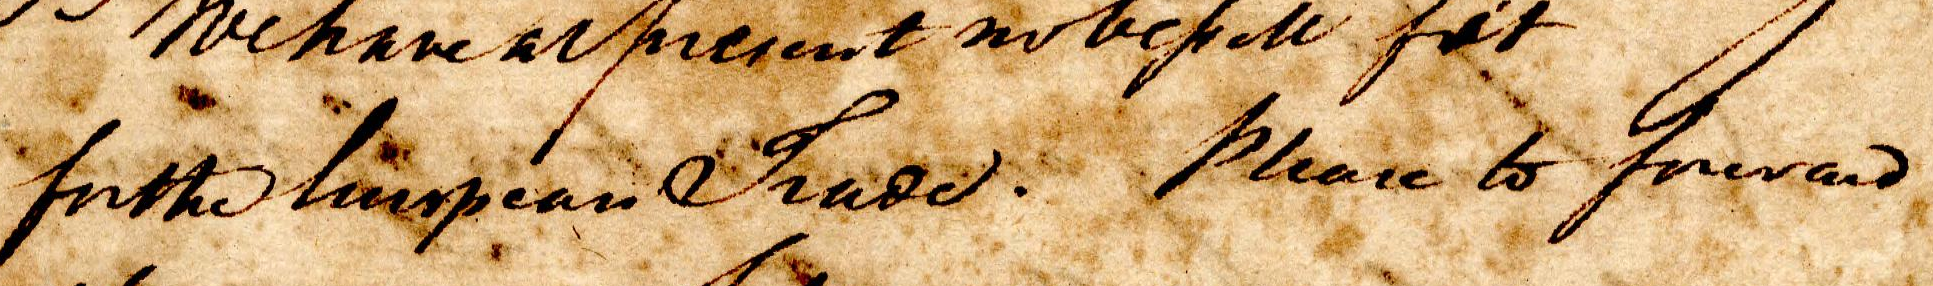for the European Trade. Please to forward
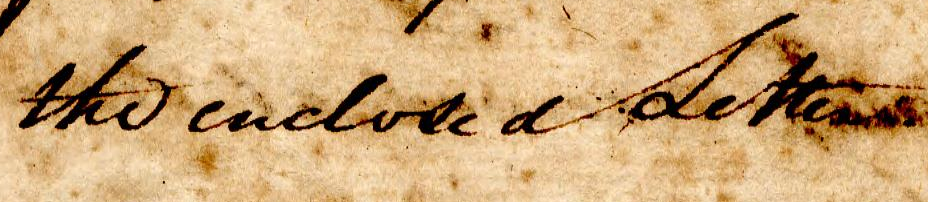the enclosed Letter
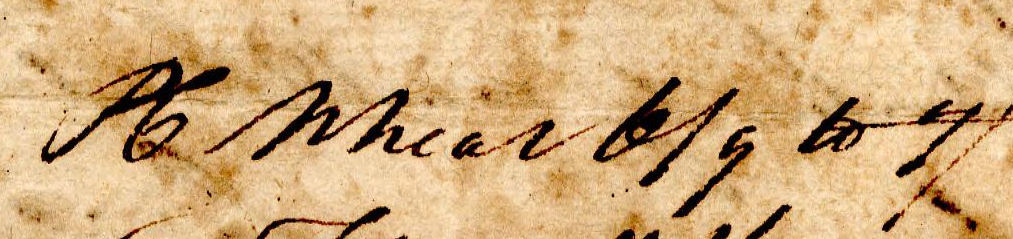PG Wheat 6s9 to 7s
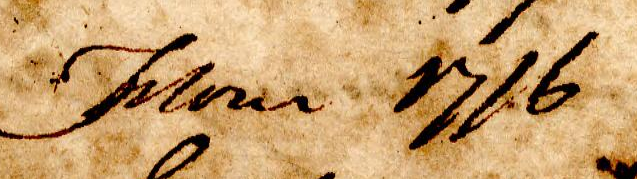Flour 17s6
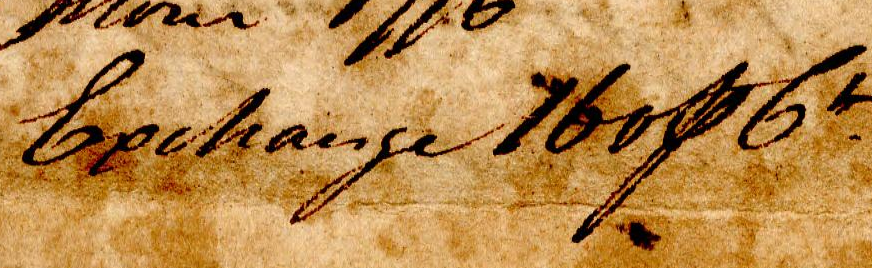Exchange 76o per 6
